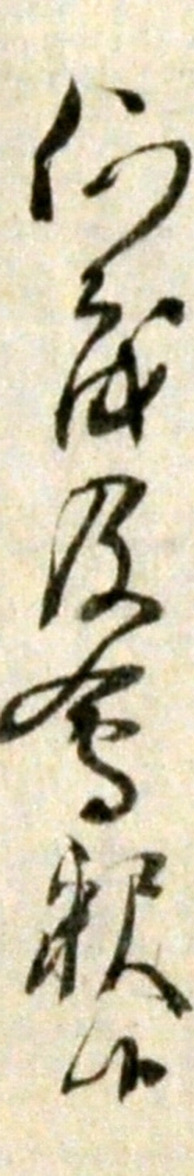何茂及会釈候
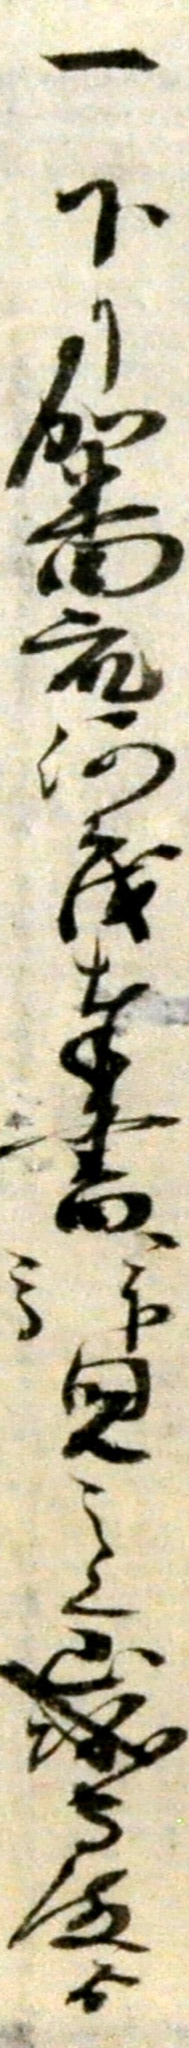一下り加番衆何茂奉書拝見之上山城守殿ゟ
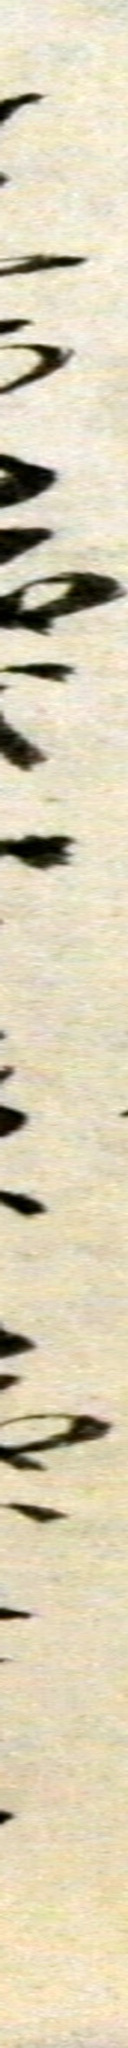奉書御城代江被差出御城代一覧之上

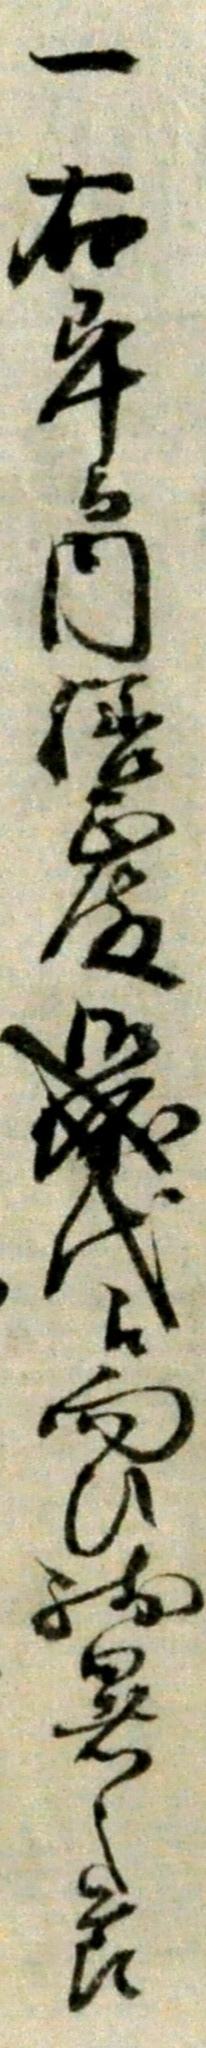一右卆而内膳正殿御城代江向ひ残暑之節
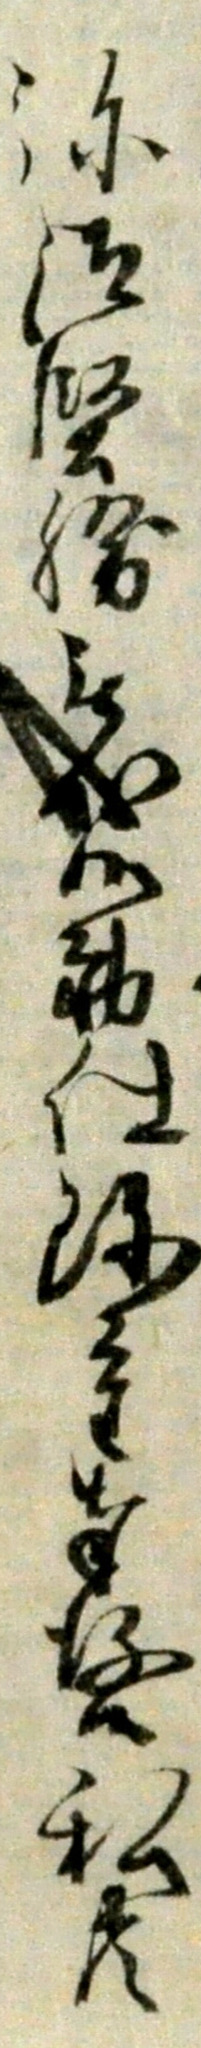弥御賢勝被成御勤仕珍重奉存候私共
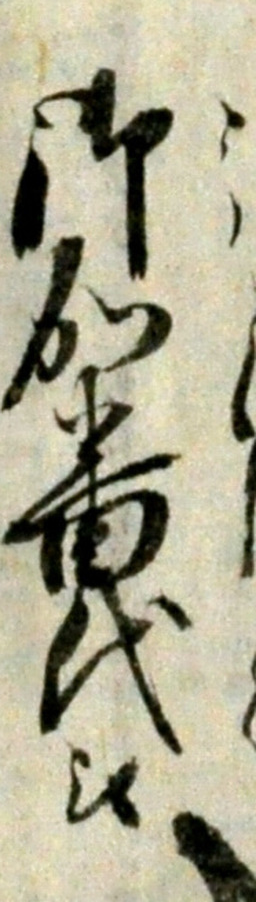御加番代被
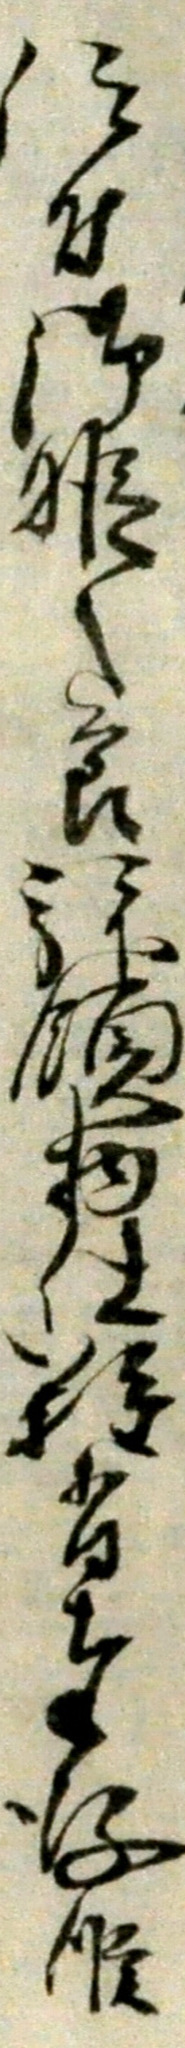仰付御暇之節拝領物仕難有奉存候
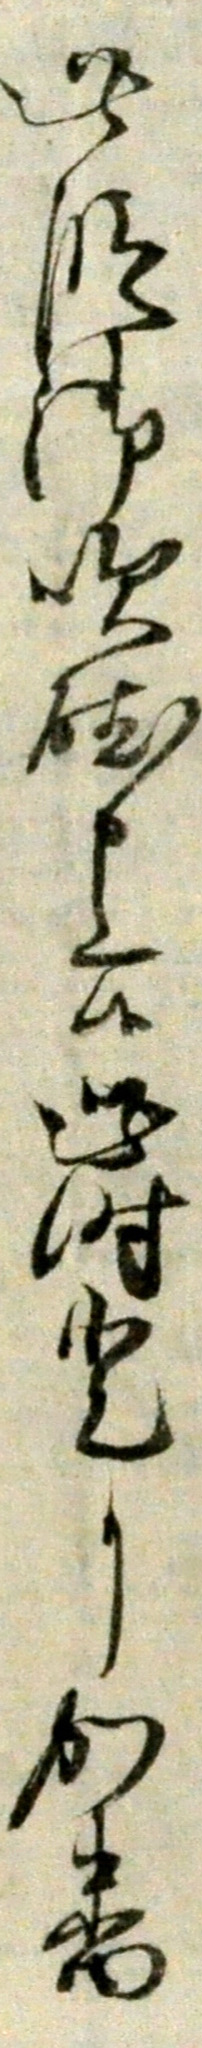此段御吹聴申上候此時登り加番
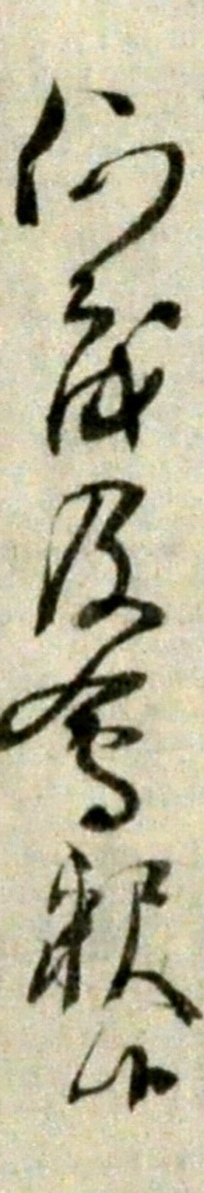何茂及会釈候
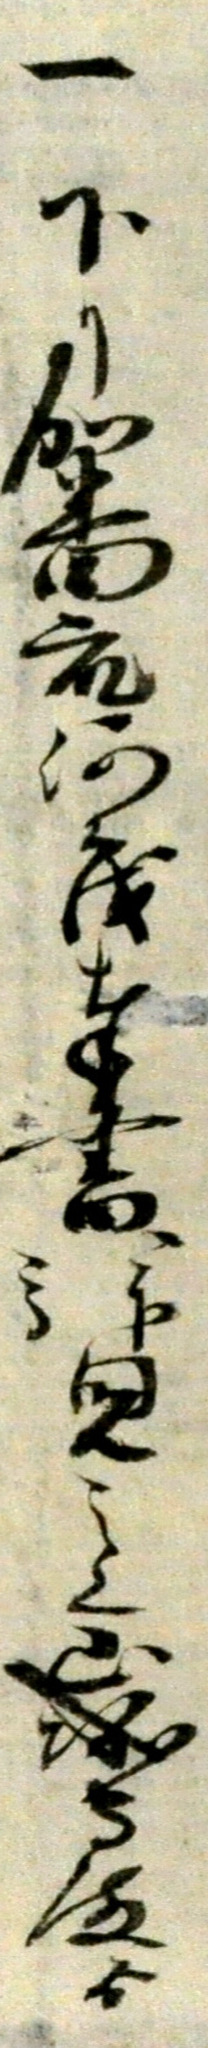一下り加番衆何茂奉書拝見之上山城守殿ゟ
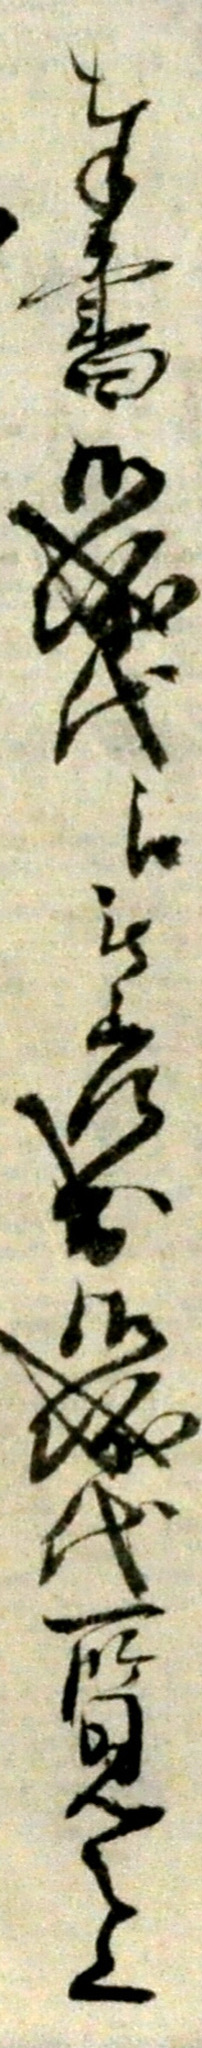奉書御城代江被差出御城代一覧之上
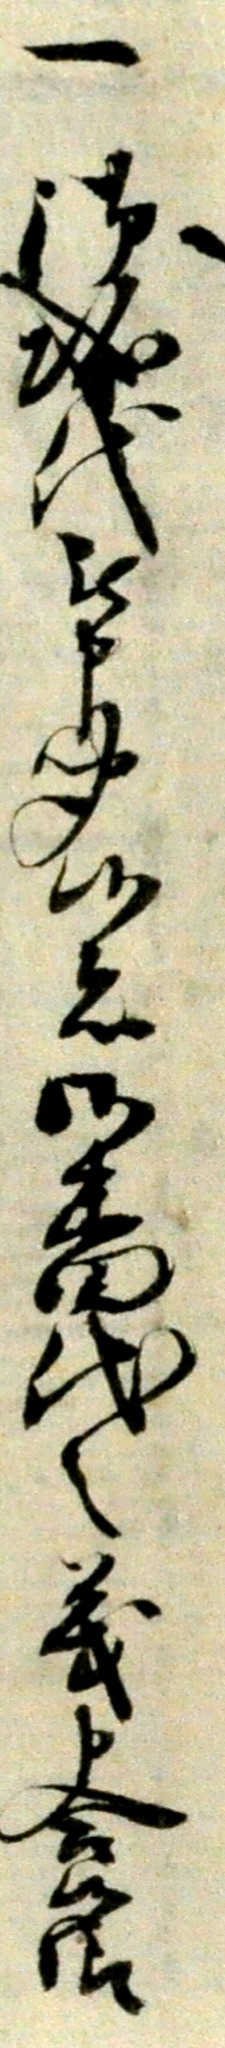一御城代被申聞候者御番代之義申合候様
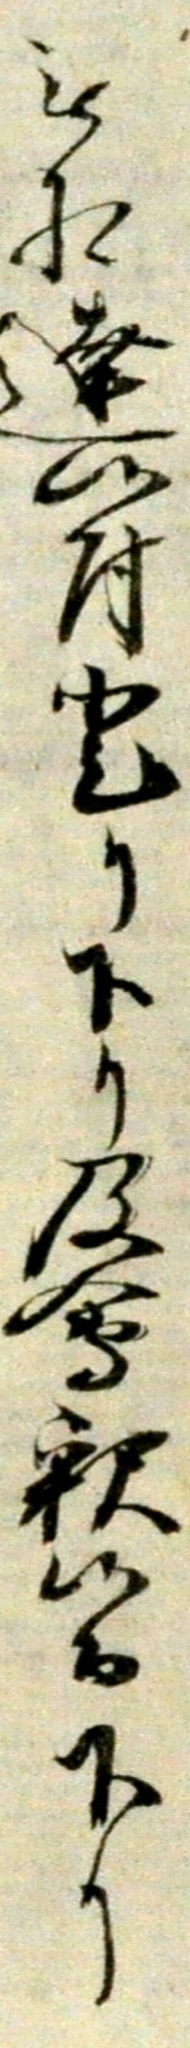被相達候付登り下り及会釈候而下り
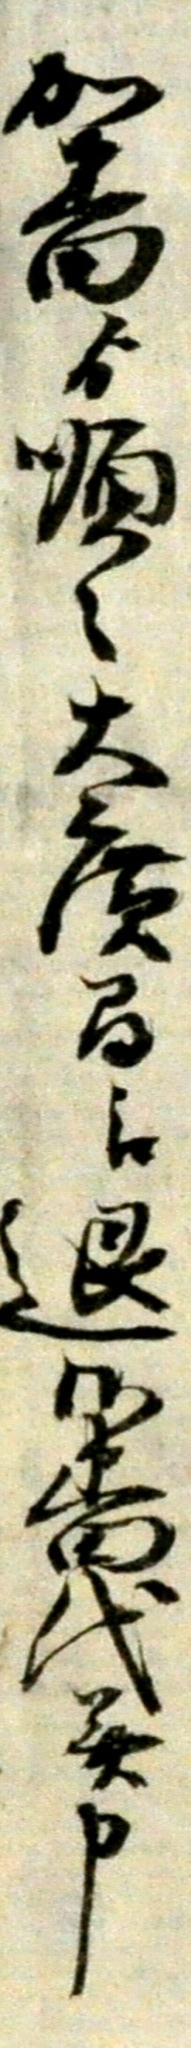加番ゟ順々大広間江退御番代幷申
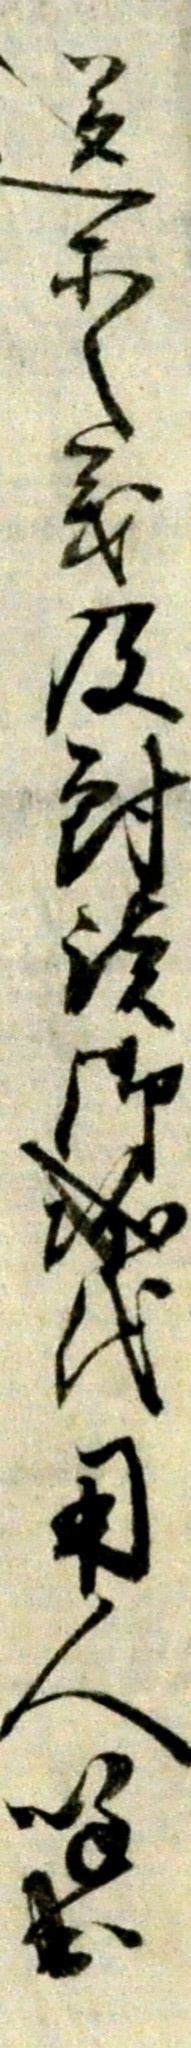送等之義及対談御城代用人呼出
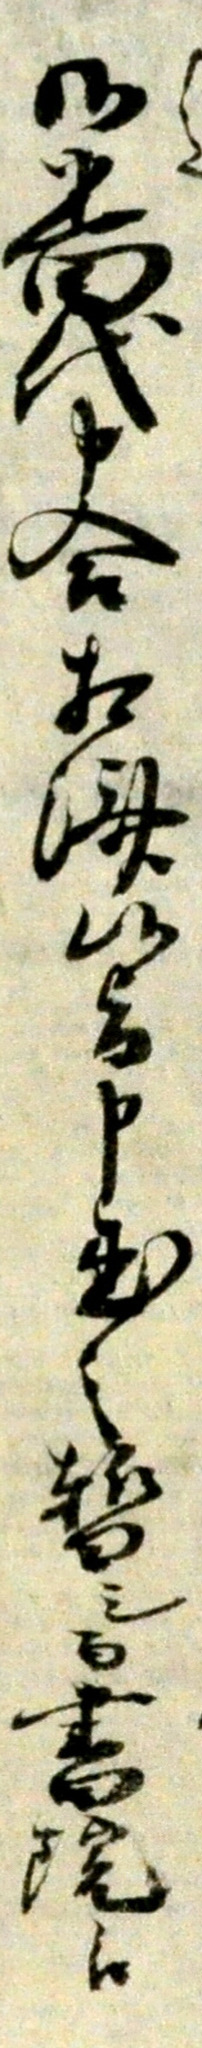御番代申合相済候旨申出之暫ㇱ而書院江
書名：大阪加番関係諸書留〔一括〕
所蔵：伊那市立高遠町図書館・合同会社AMANE
